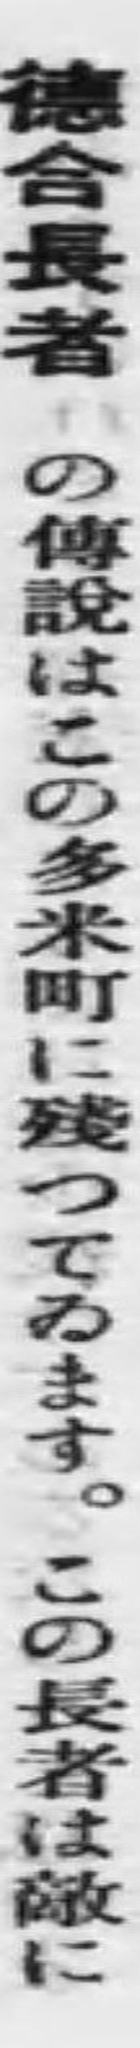徳合長者の伝説はこの多米町に残つてゐます。この長者は敵に
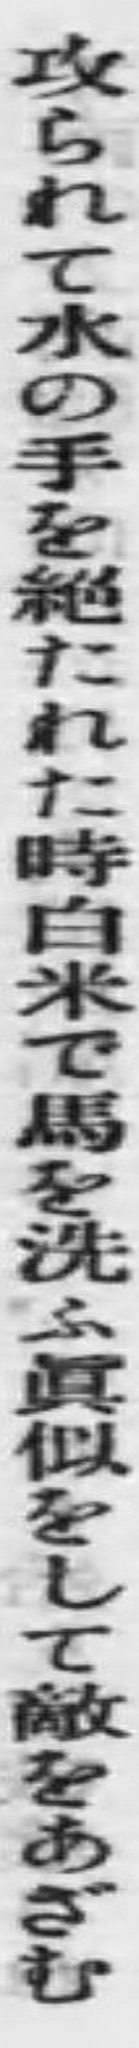攻られて水の手を絶たれた時白米で馬を洗ふ真似をして敵をあざむ
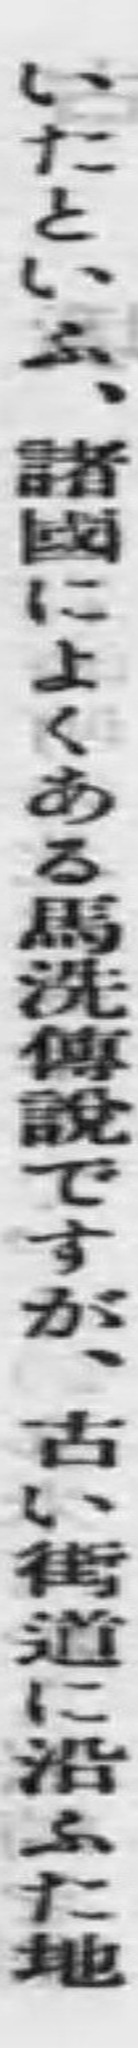いたといふ、諸国によくある馬洗伝説ですが、古い街道に沿ふた地
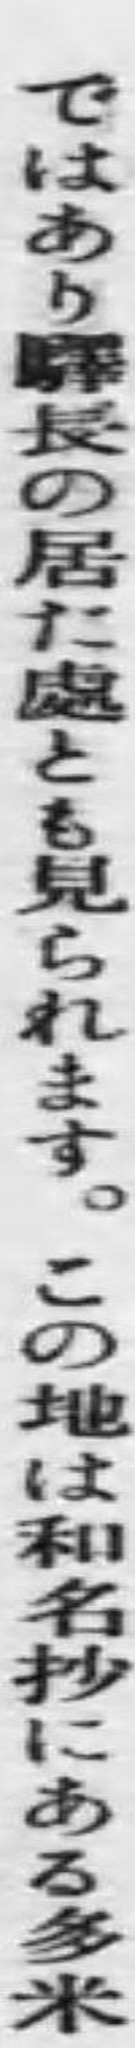ではあり駅長の居た処とも見られます。この地は和名抄にある多米
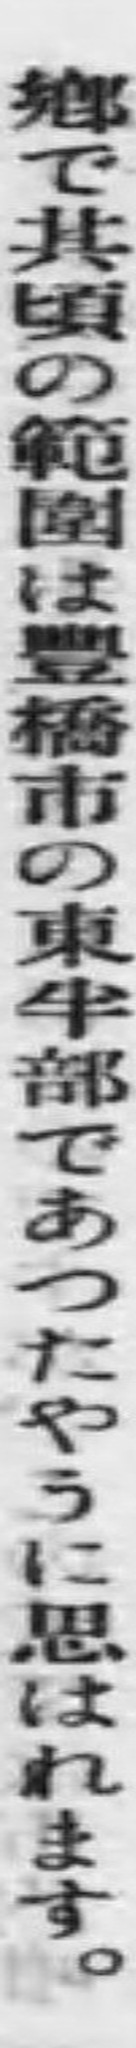郷で其頃の範囲は豊橋市の東半部であつたやうに思はれます。
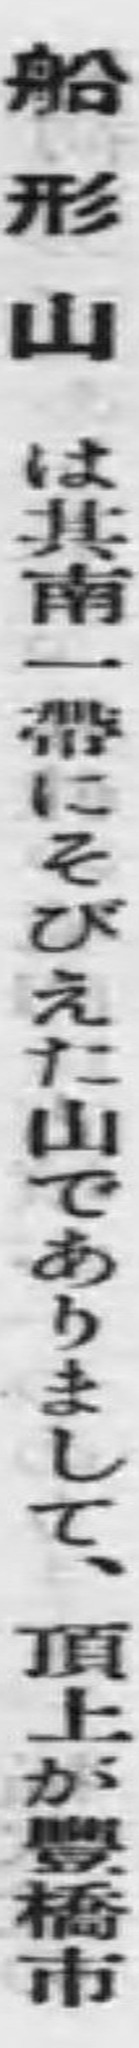船形山は其南一帯にそびえた山でありまして、頂上が豊橋市
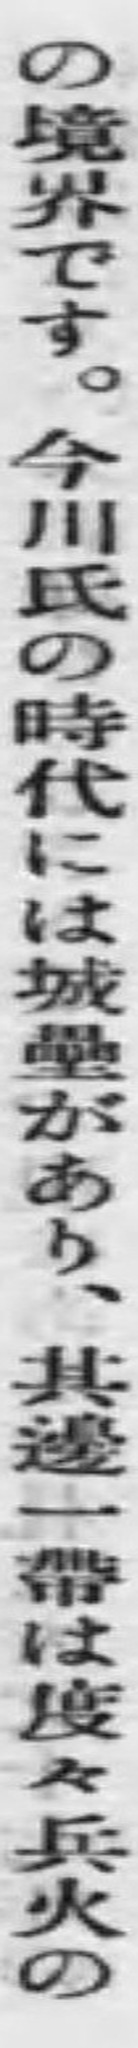の境界です。今川氏の時代には城塁があり、其辺一帯は度々兵火の
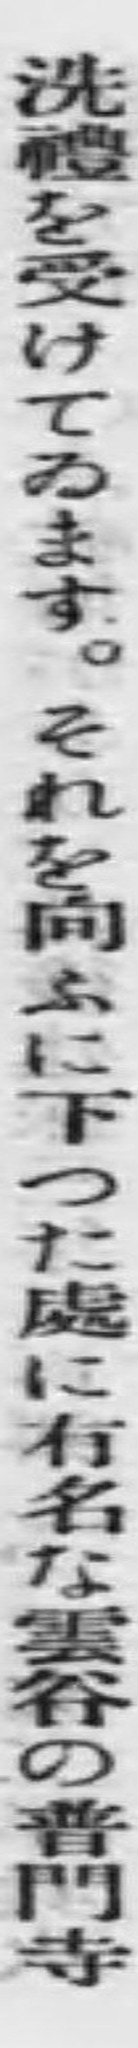洗礼を受けてゐます。それを向ふに下つた処に有名な雲谷の普門寺
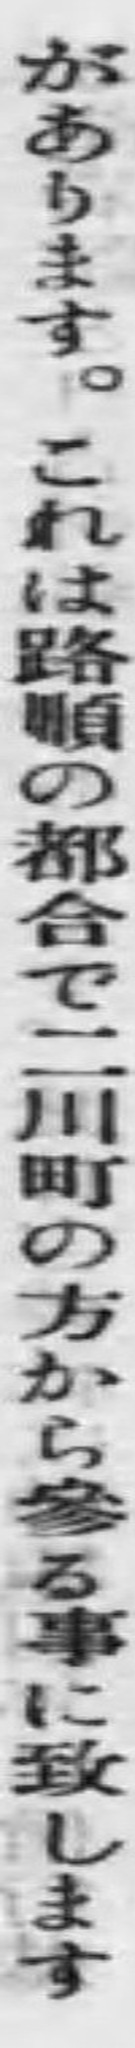があります。これは路順の都合で二川町の方から参る事に致します
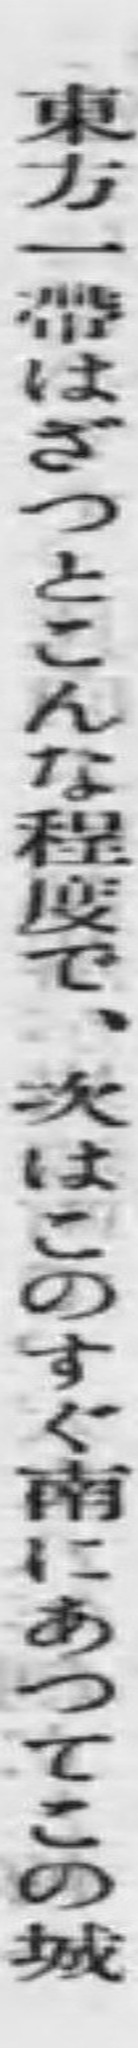東方一帯はざつとこんな程度で、次はこのすぐ南にあつてこの城
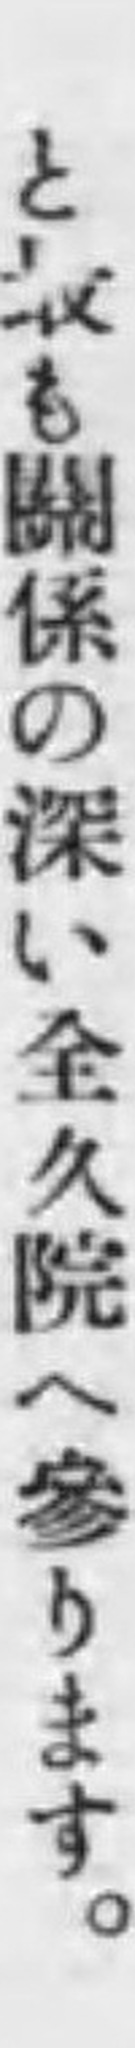と最も関係の深い全久院へ参ります。
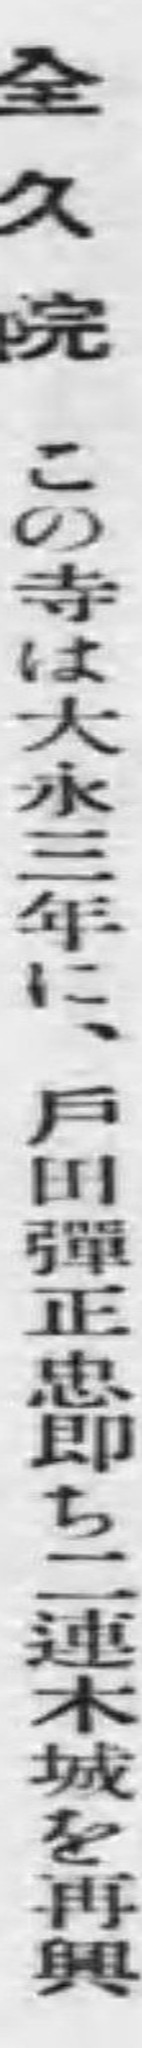全久院この寺は大永三年に、戸田弾正忠即ち二連木城を再興
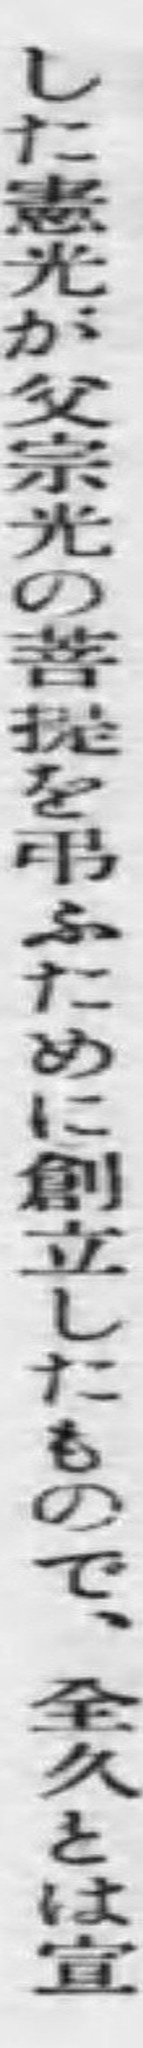した憲光が父宗光の菩提を弔ふために創立したもので、全久とは宣
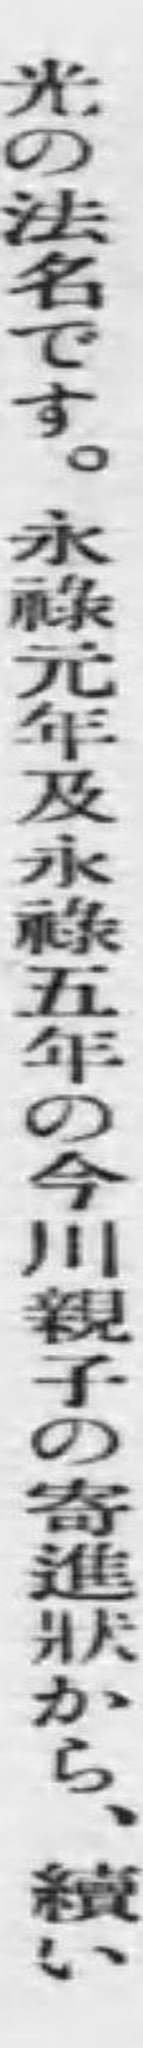光の法名です。元禄元年及永禄五年の今川親子の寄進状から、続い
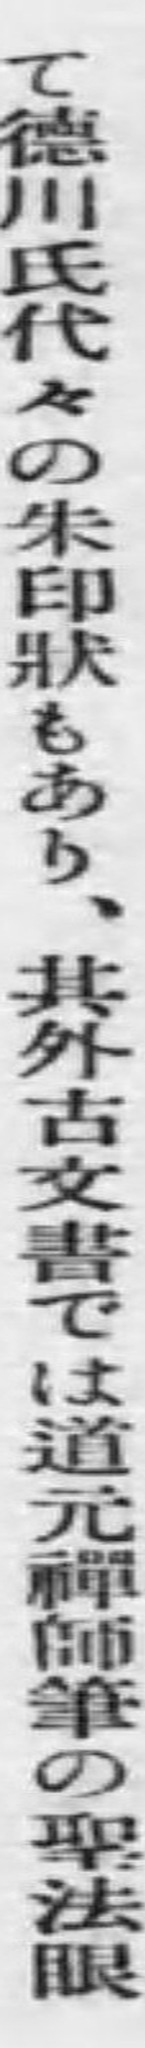て徳川氏代々の朱印状もあり、其外古文書では道元禅師筆の聖法眼
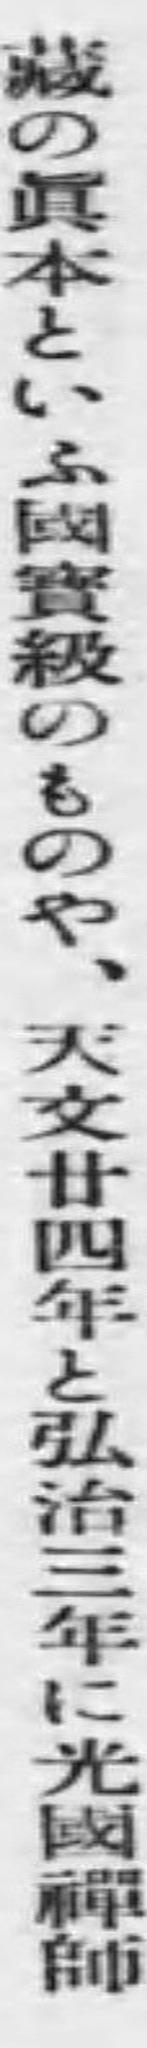蔵の真本といふ国宝級のものや、天文廿四年と弘治三年に光国禅師
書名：東三河道中記 : 豊橋市及其附近案内
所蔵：国立国会図書館 National Diet Library, JAPAN
